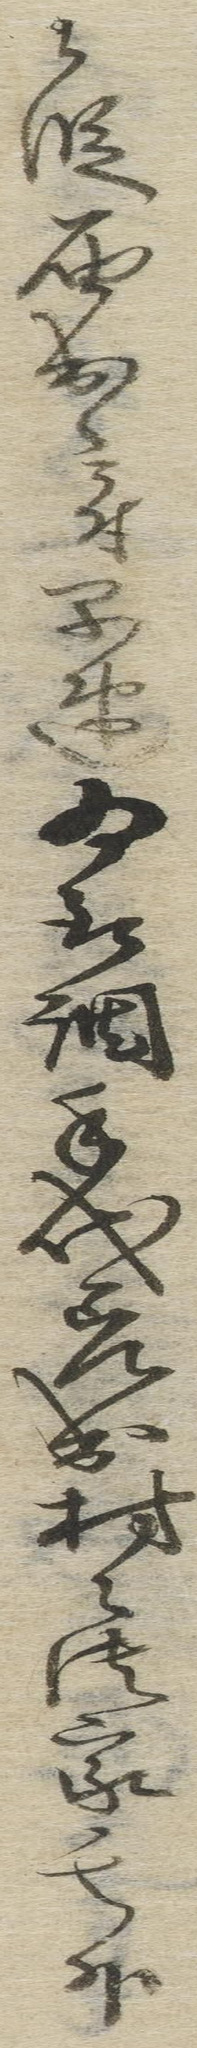候段届出候二付早速為取調手代差出村々潰家其外

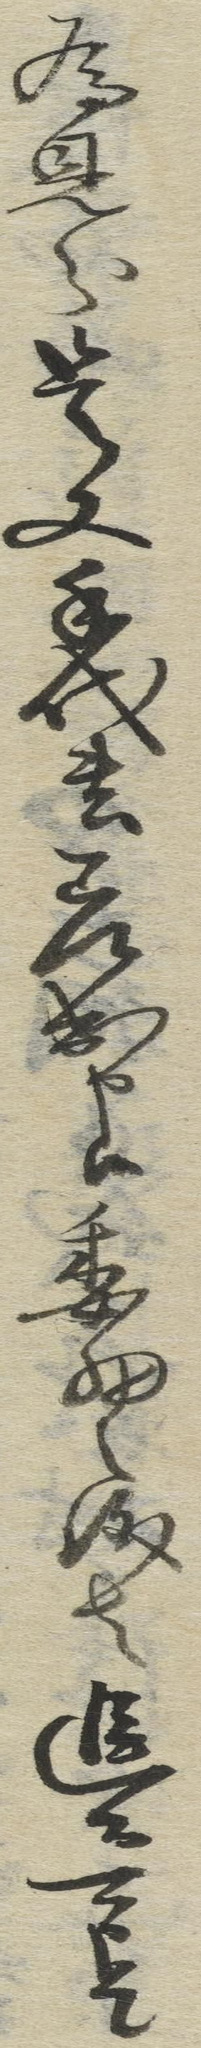為見分且又手代共差出申候委細之儀者追而可申上候
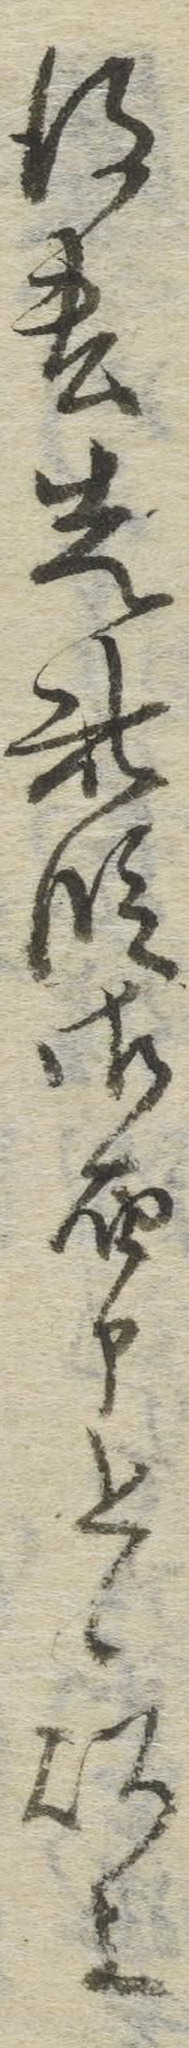得共先此段御届申上候以上
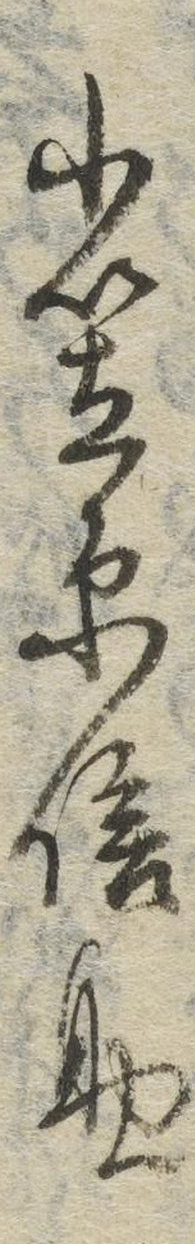小笠原信助
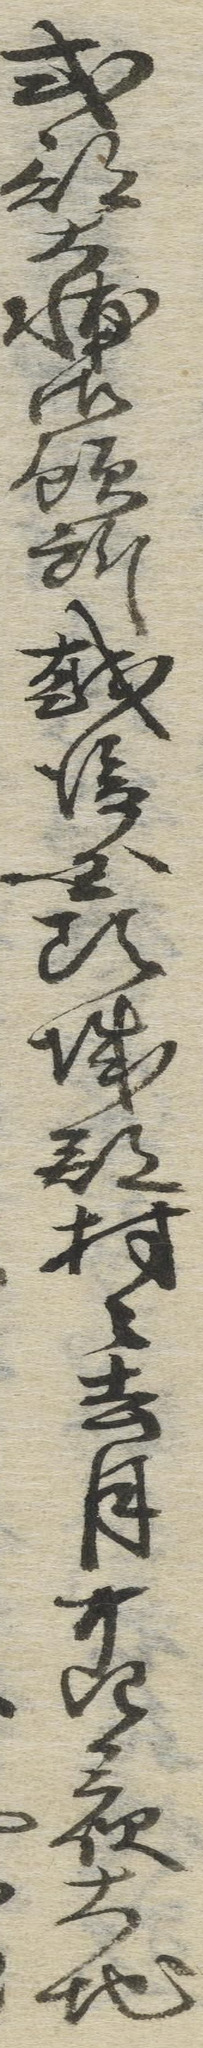式部大輔御領所越後国頸城郡村々去月廿四日夜大地
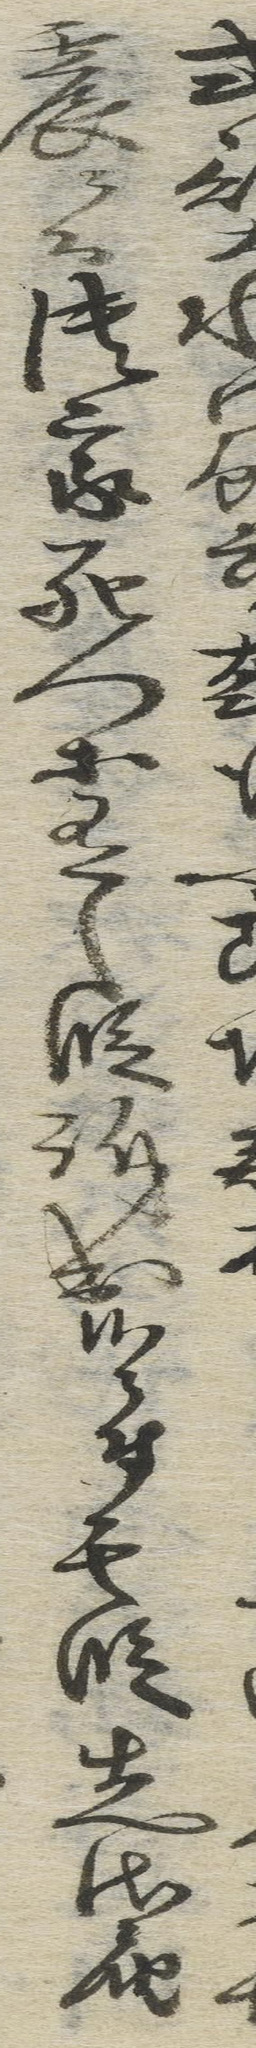震二而潰家死人等有之段訴出候二付其段先御届
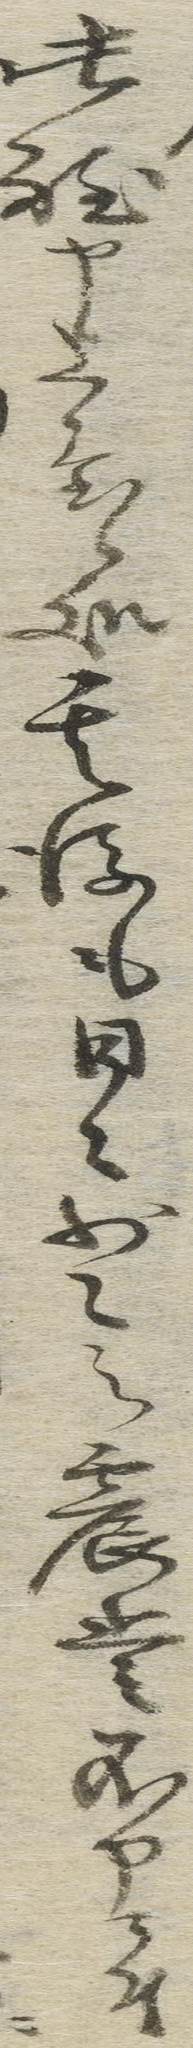此程申上置処所其後も日々少々之震止ミ不申候付
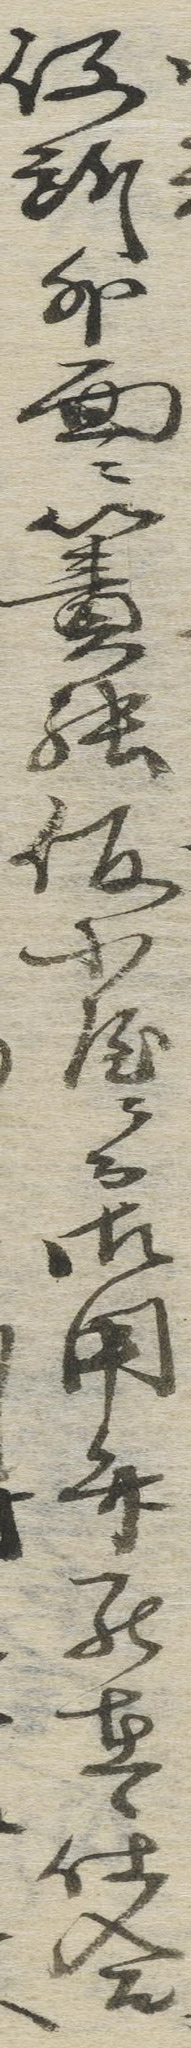役所外面々簀張仮小屋二而御用弁罷在候仕会二
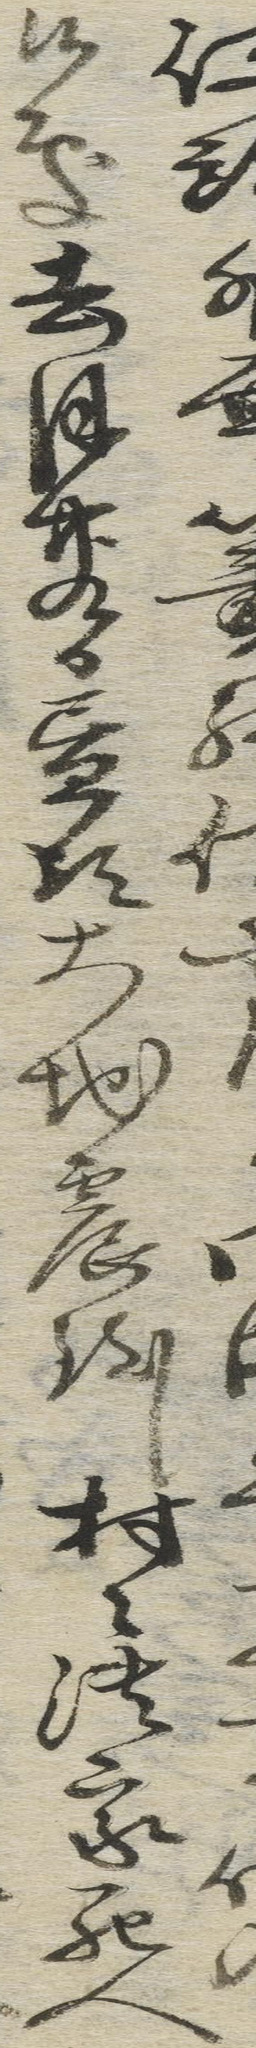候処去月廿九日昼頃大地震致し村々潰家死人
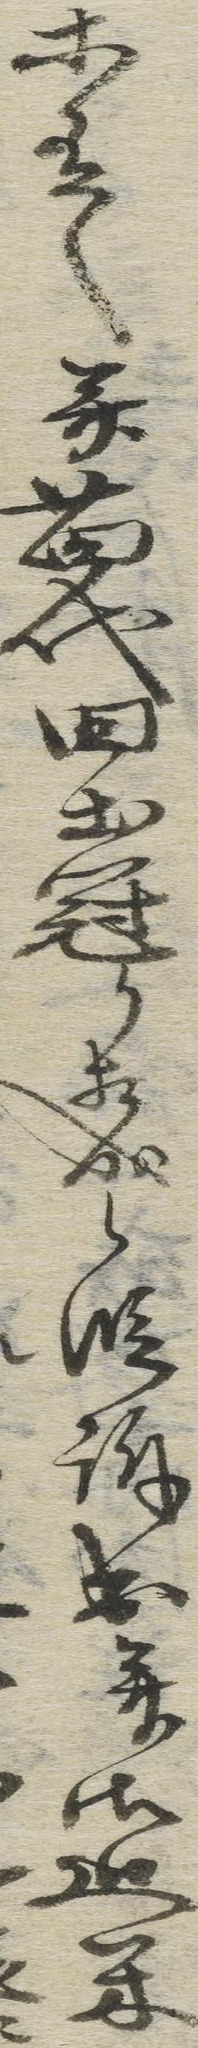等有之并苗代田土冠相成候段訴出并御廻米
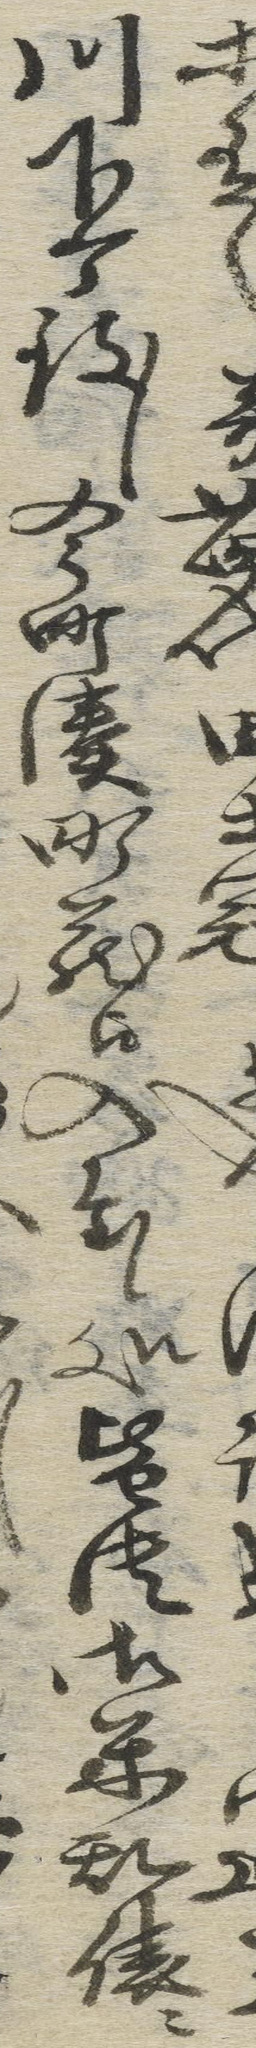川下ヶ致し今町湊町蔵江入置候処皆潰御米乱俵二
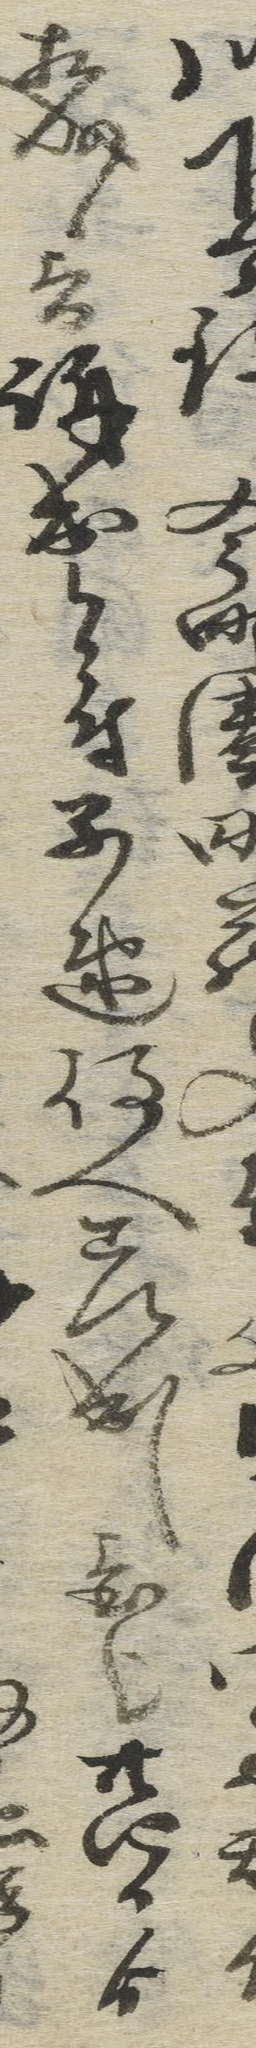相成候旨訴出候二付早速役人差出し置申候廿四日ゟ
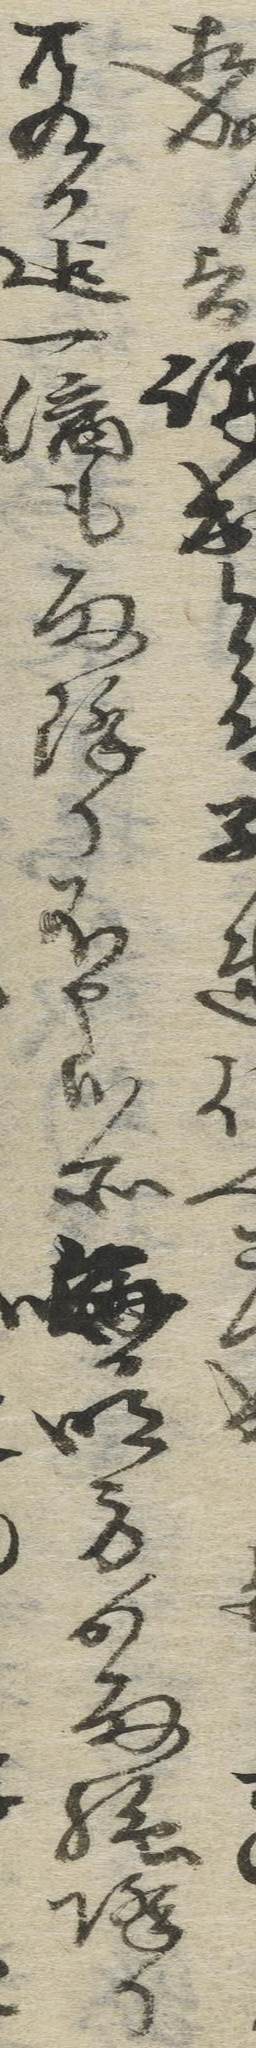廿九日迄一滴も雨降不申候所晦日明方ゟ雨強降り
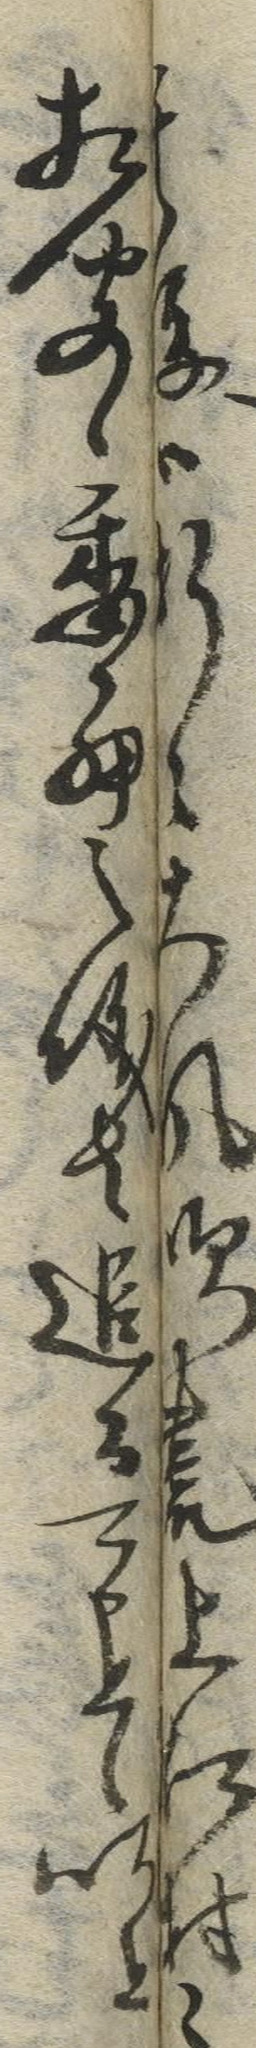相聞候委細之儀ハ追而可申上候以上
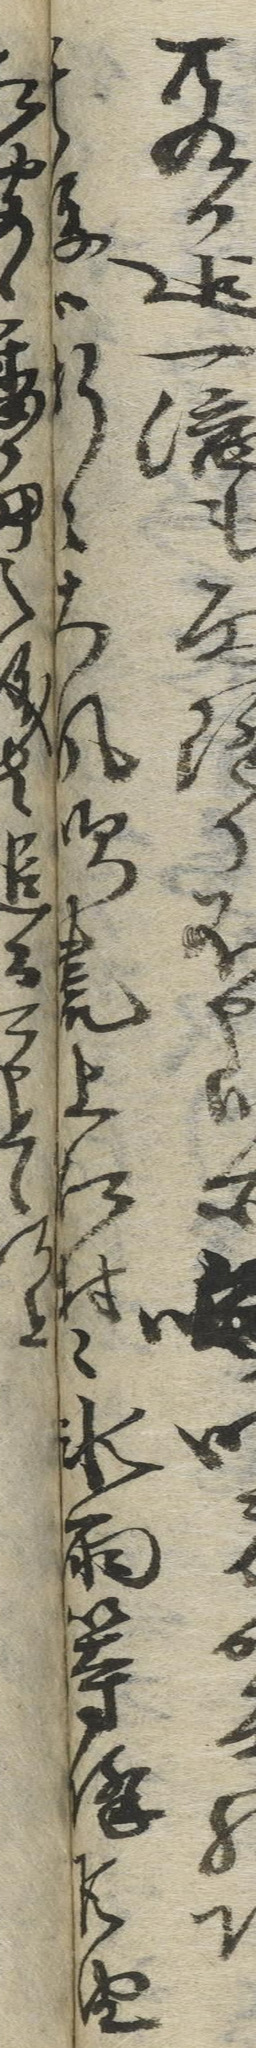其後折々大風吹上郷村々氷雨等降候由
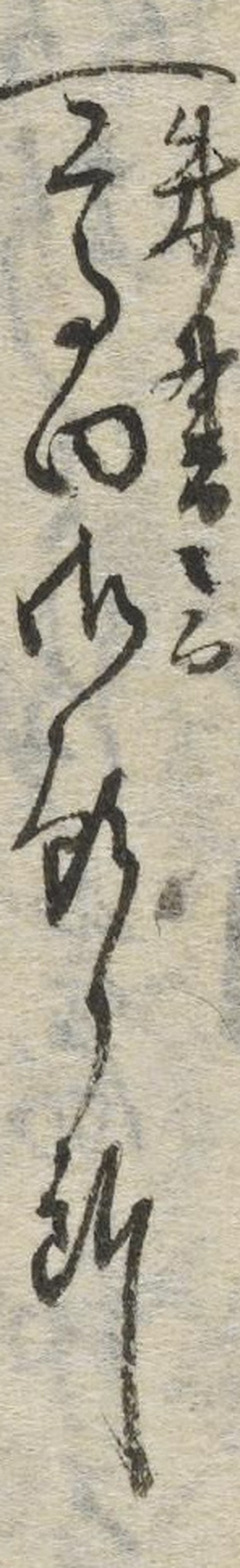高田御預所
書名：信濃越後　地震書留
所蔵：東京大学地震研究所図書室 Earthquake Research Institute Library, The University of Tokyo, JAPAN
